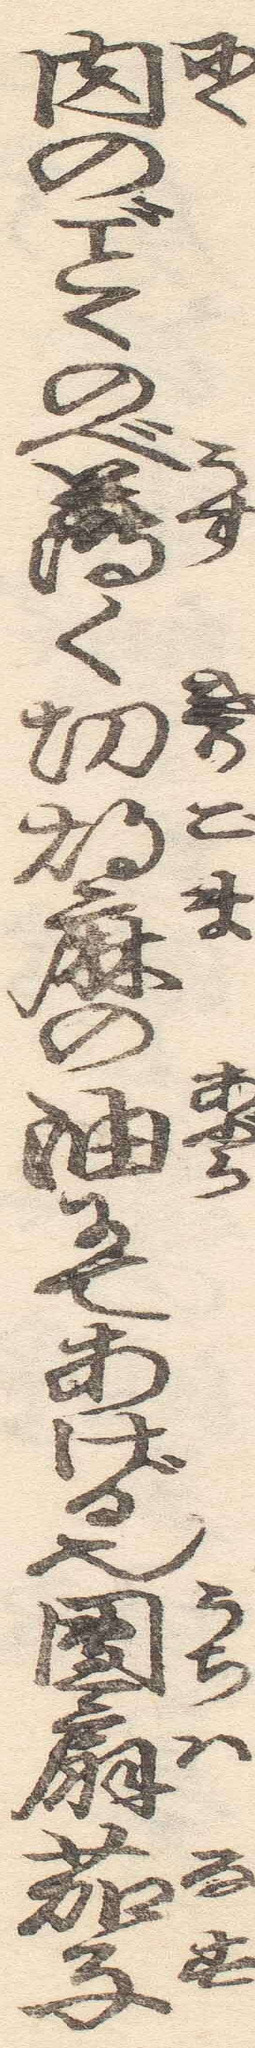肉のごとくのべ薄く切胡麻の油にてあげる也団扇茄子
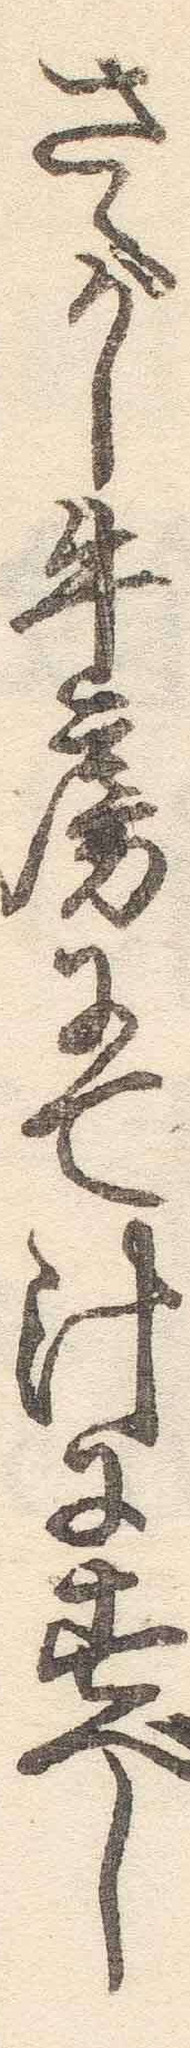さゝがし牛蒡にて汁にすべし
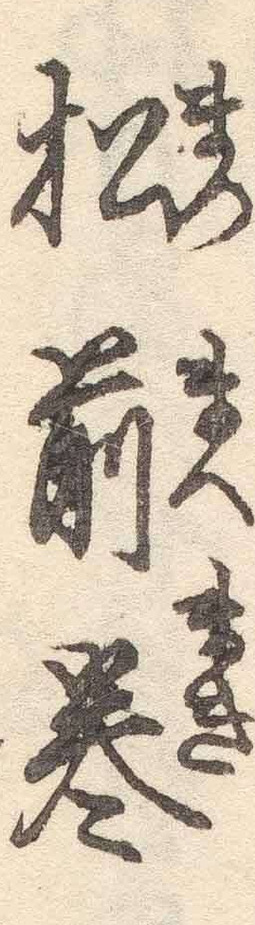松前巻
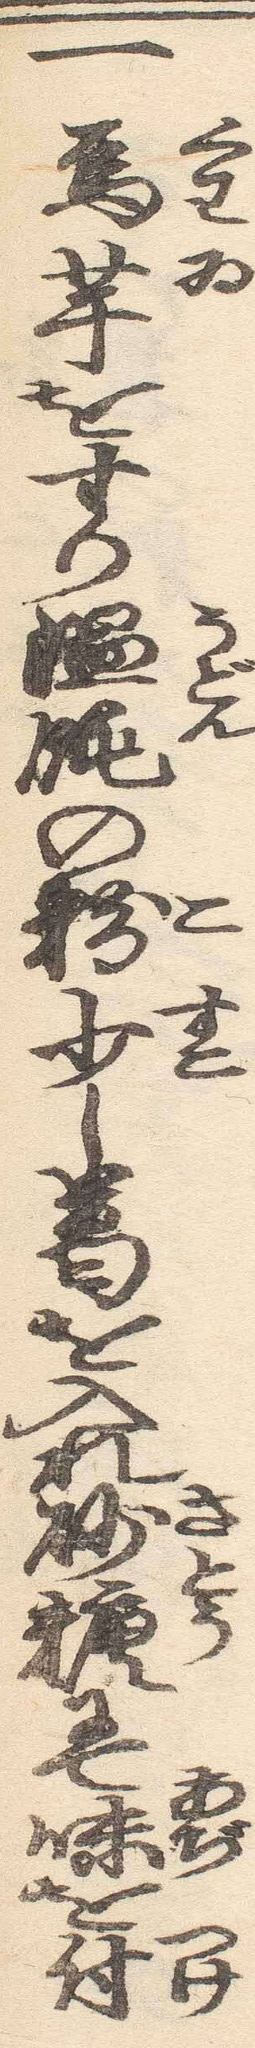一烏芋をすり饂飩の粉少し葛を入れ砂糖にて味を付
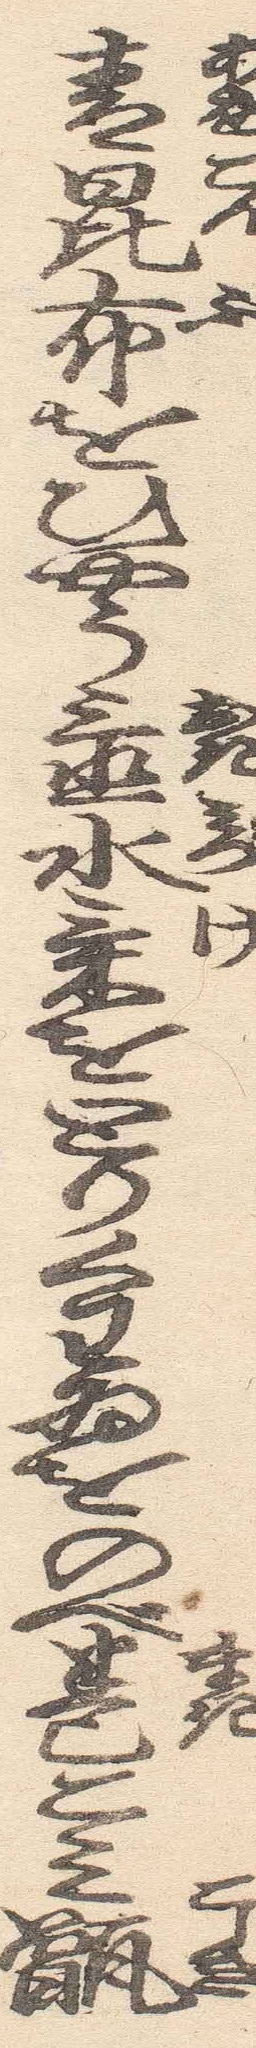青昆布をひやう置水気をとりくわゐをのべ巻こみ甑
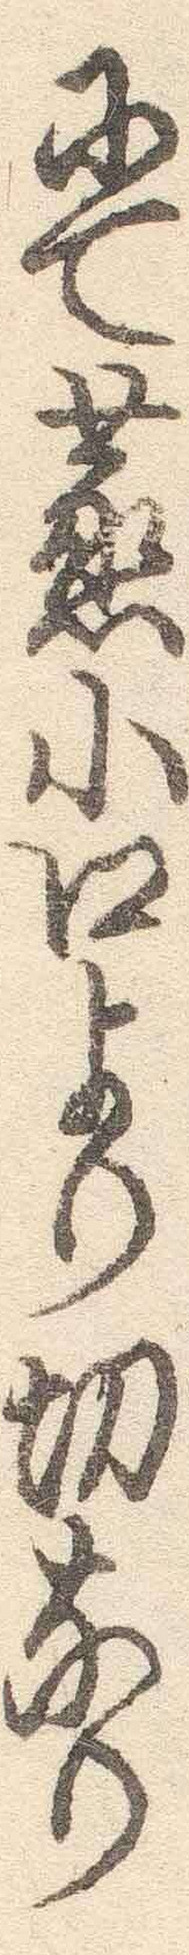にて蒸小口より切なり
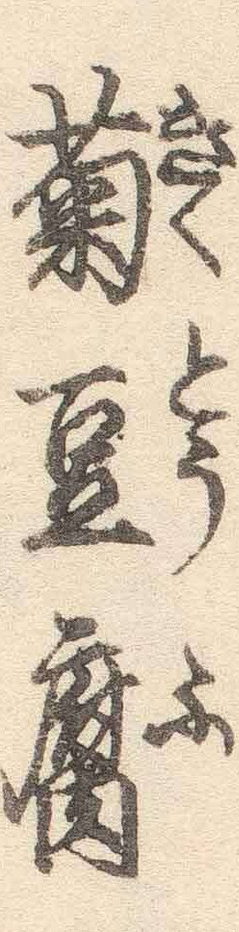菊豆腐
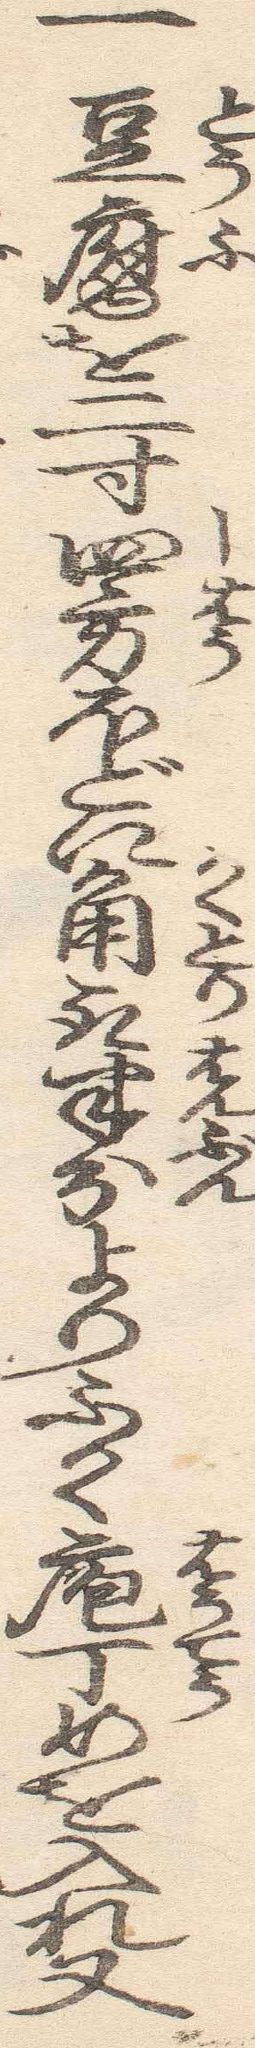一豆腐を二寸四方ほどに角取半分よりふかく庖丁めを入れ又
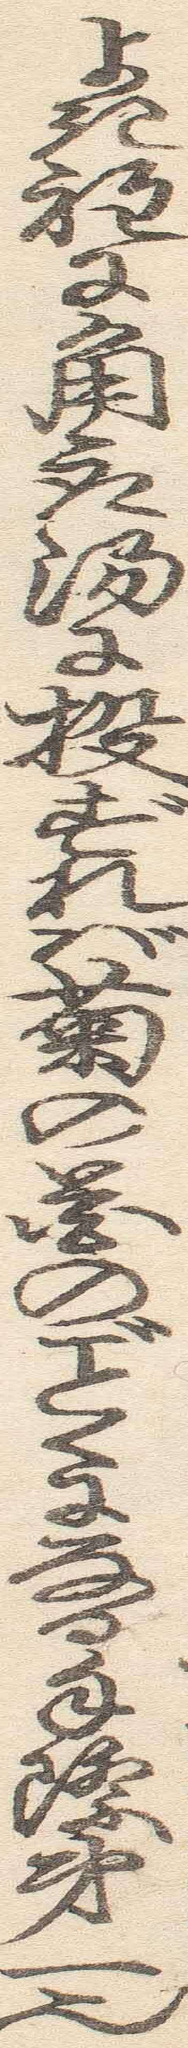よき程に角取湯に投ずれば菊の花のごとくになる手際第一也
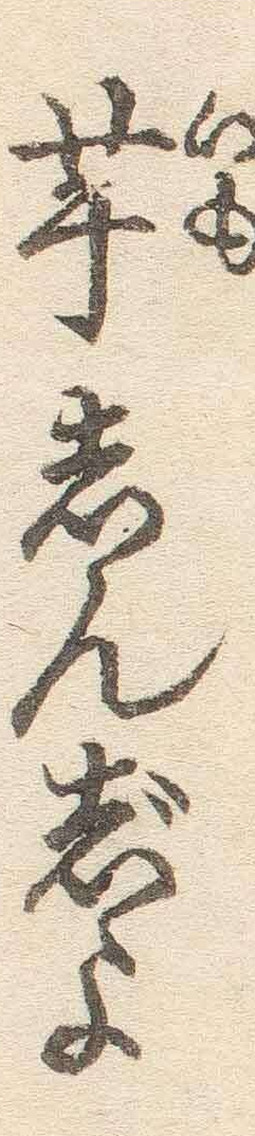芋しんじよ
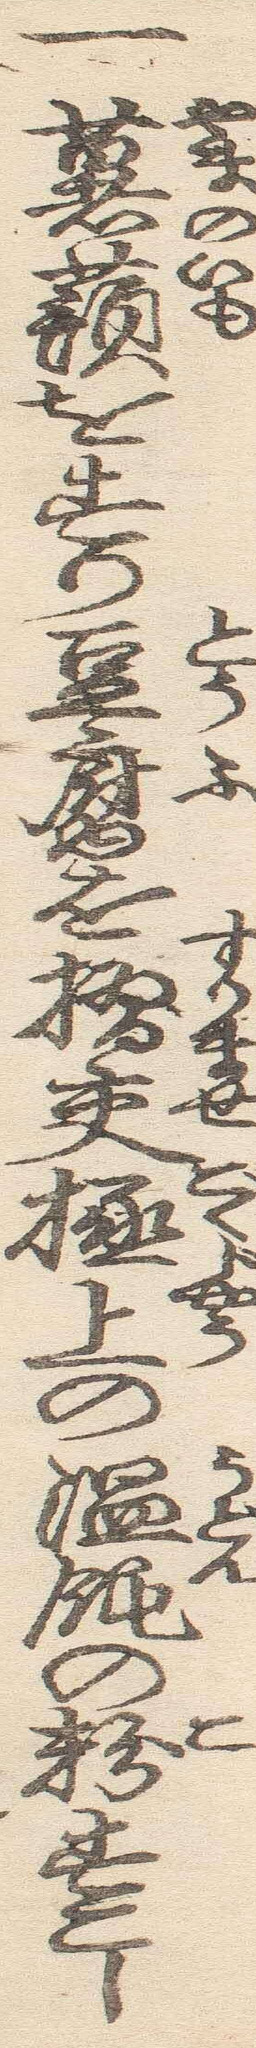一薯蕷をすり豆腐を摺交極上の饂飩の粉すこし
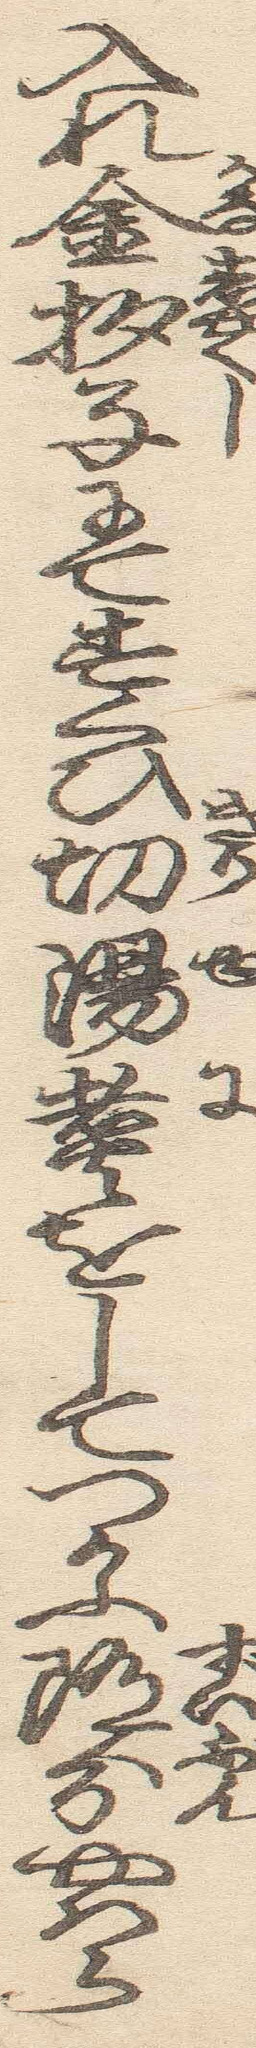入れ金杓子にてすくひ切湯煮をしてつかふ随分やはら
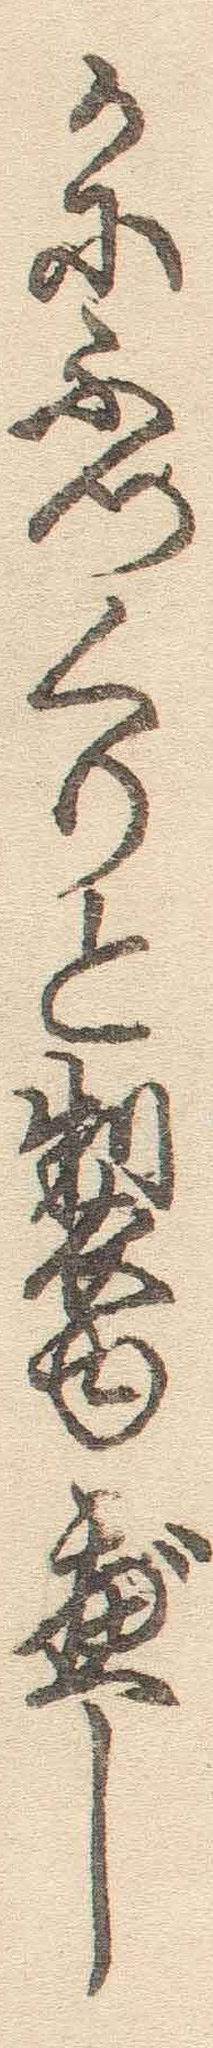かにふつくりと製ゆべし

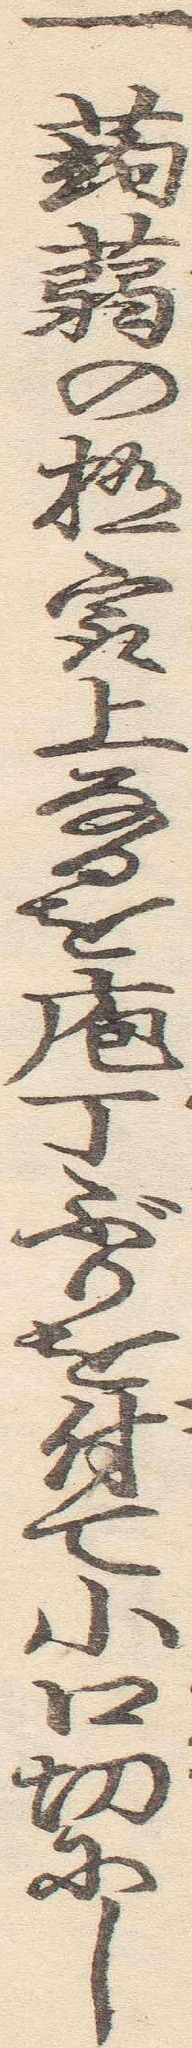一蒟蒻の極最上なるを庖丁ぶりを付て小口切にし
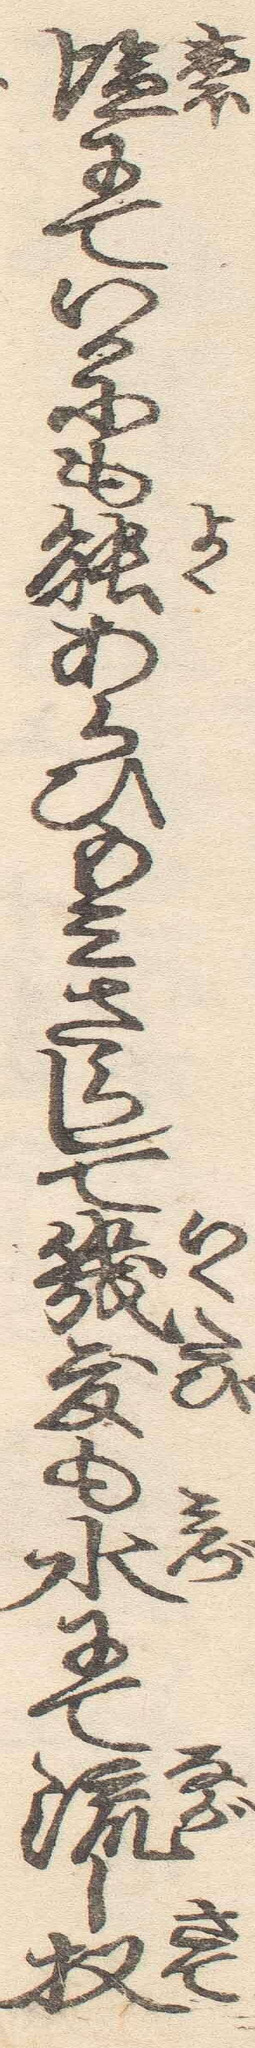塩にていかにも能あらひもみさらして幾度も水にて流し扨
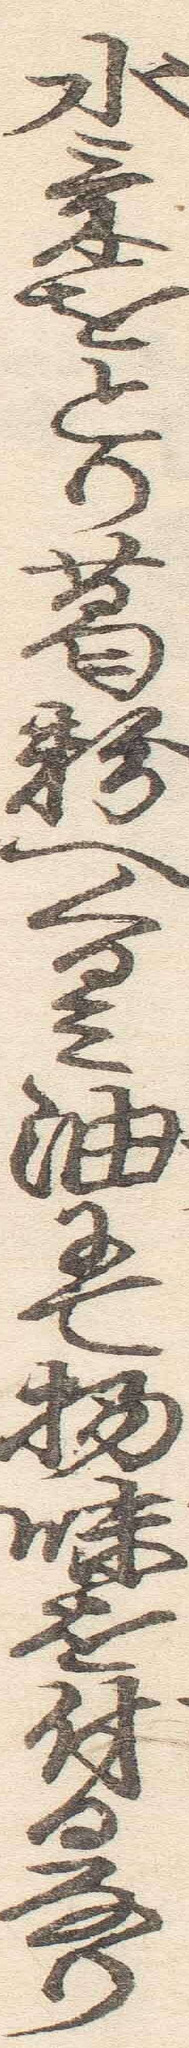水気をとり葛粉へくるみ油にて揚味を付るなり
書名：料理通
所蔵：東京学芸大学附属図書館 国文学研究資料館
